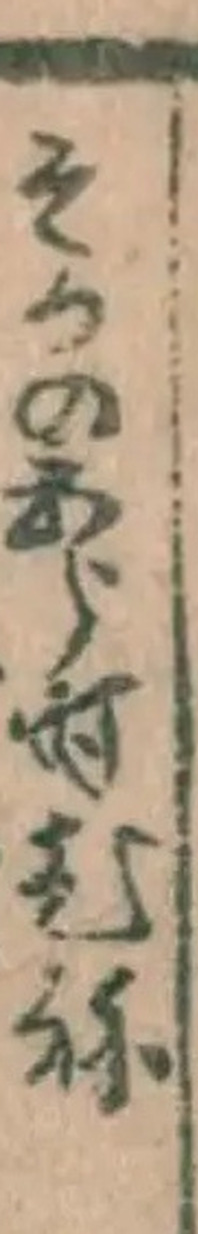そかの五郎時むね
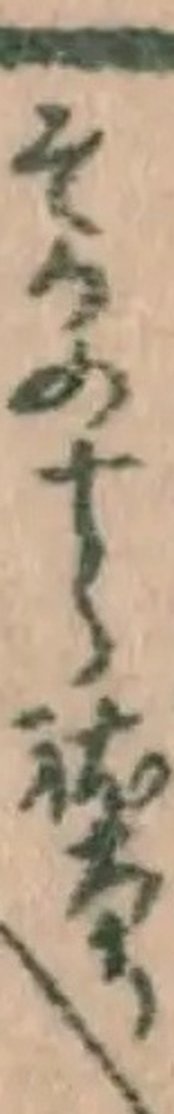そかの十郎祐なり
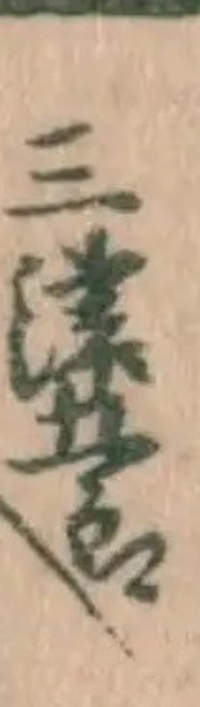三津五郎
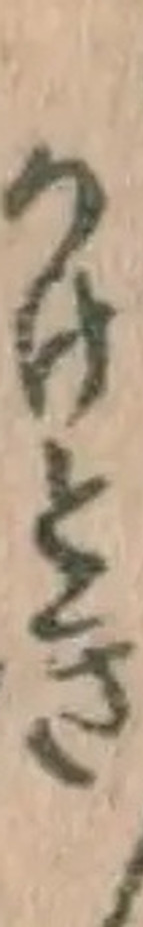かけとき
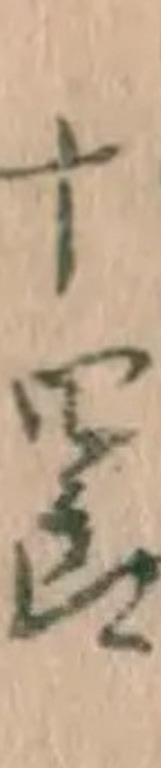十四郎
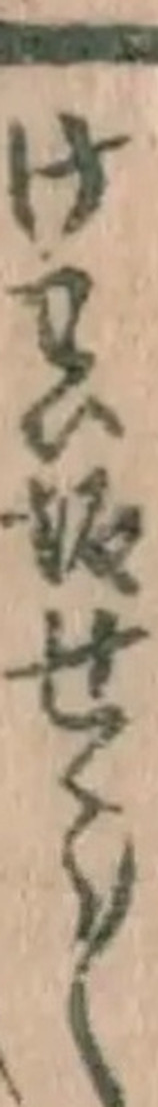けわい坂せう〳〵
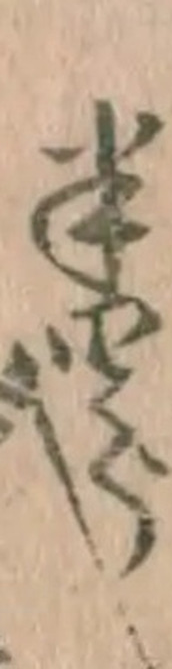半四郎
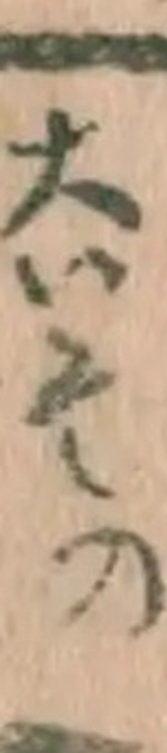大いその
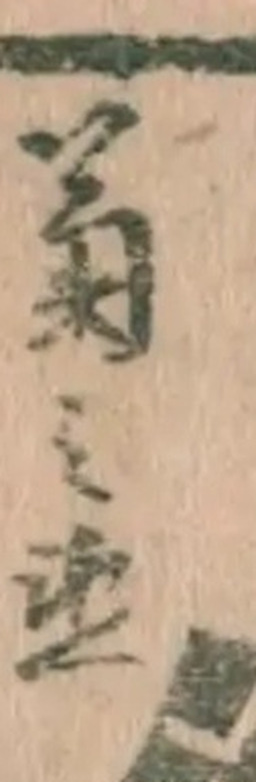菊之丞
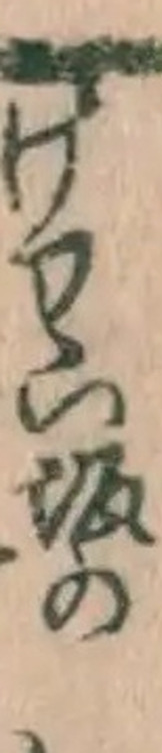けわい坂の
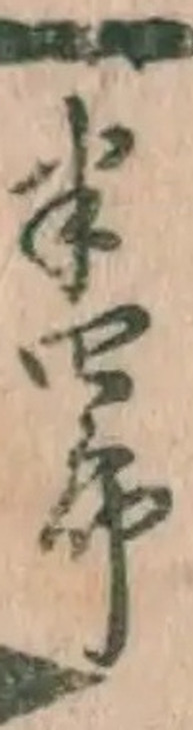半四郎
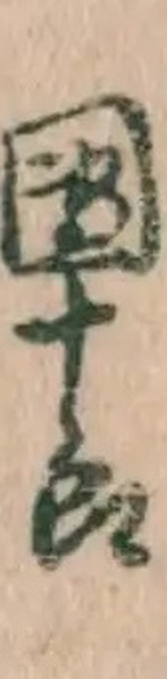団十郎
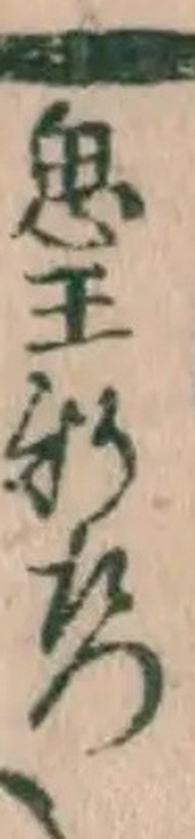鬼王新左衛門
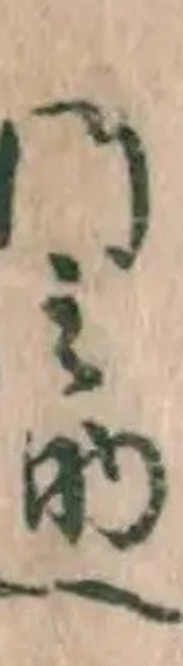門之助
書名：けいせい優曽我
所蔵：国立国会図書館 National Diet Library, JAPAN
